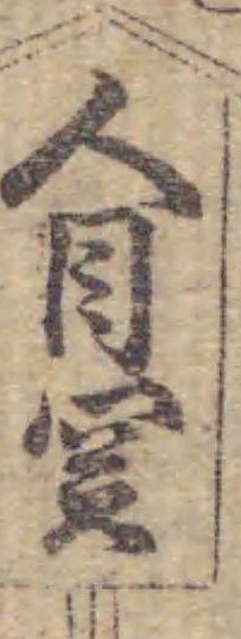人目関
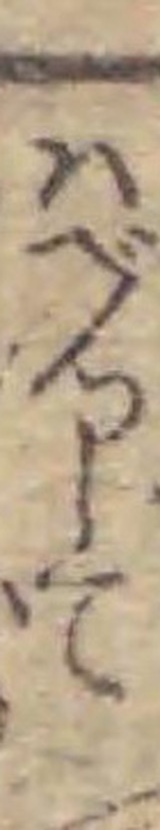はべつして
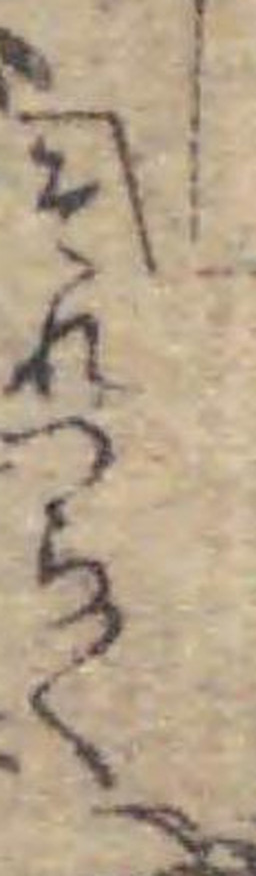〽それつら〳〵
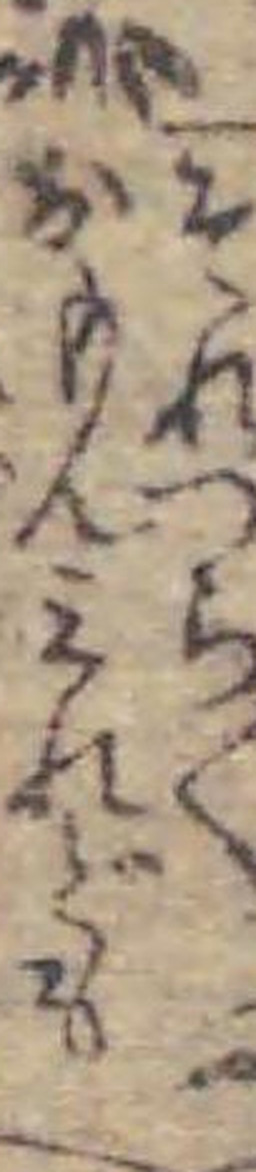おもんみれども
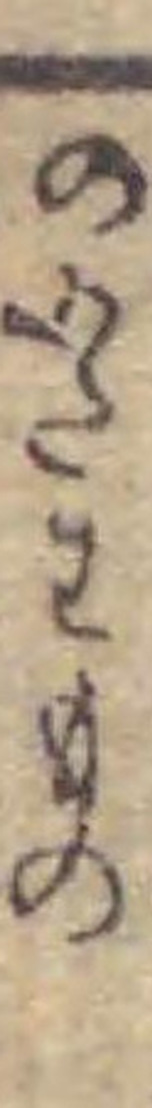のかたわもの
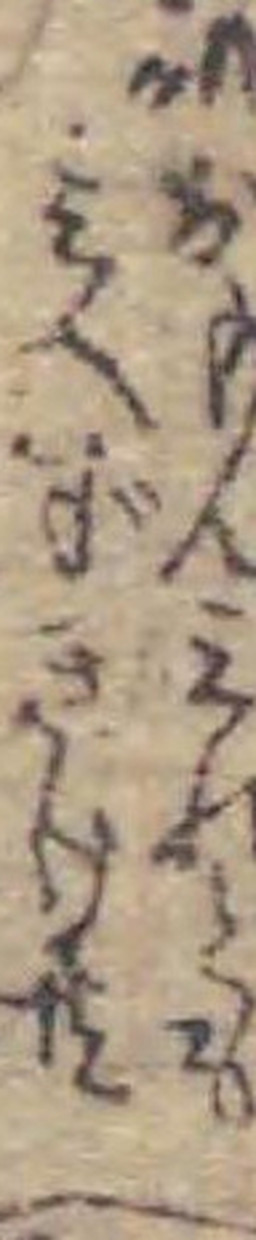みへずきけ共
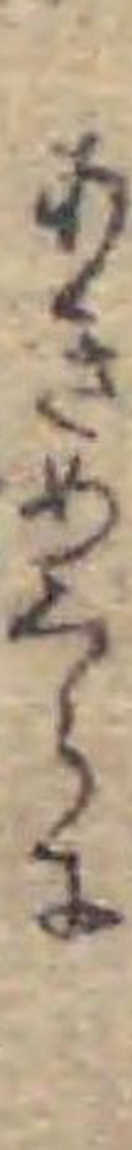あきめくらに
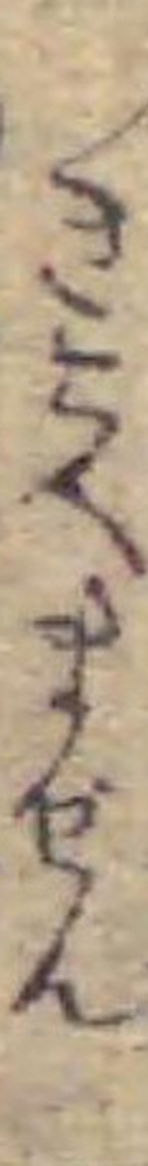きこへません
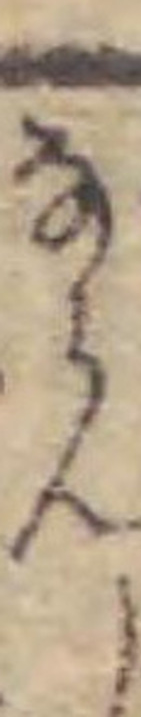ならん
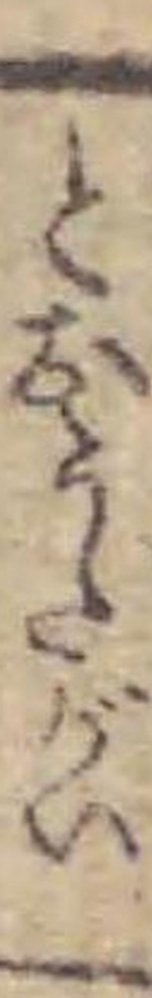とおうたがい
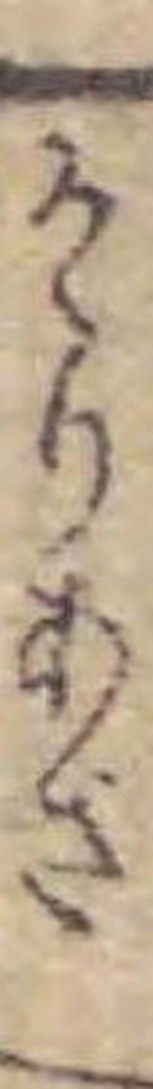かゝりあざ
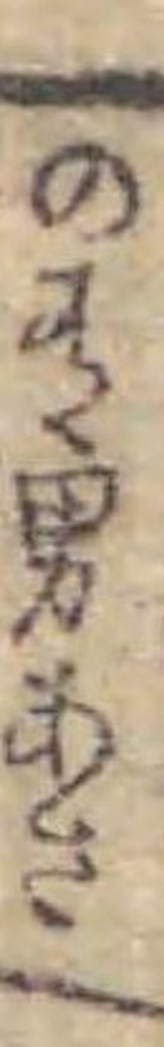の有男あさ
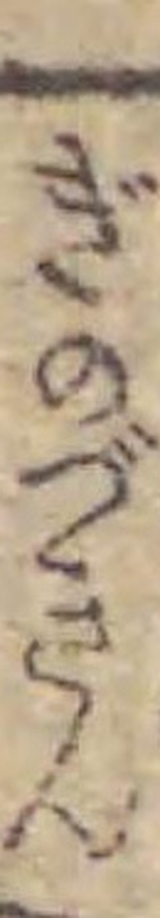ぎのづきん
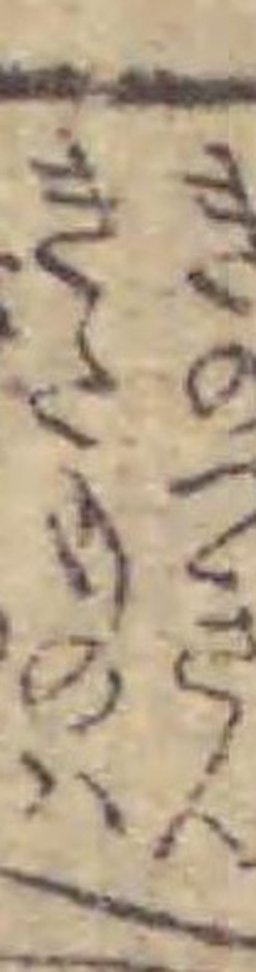きたものは
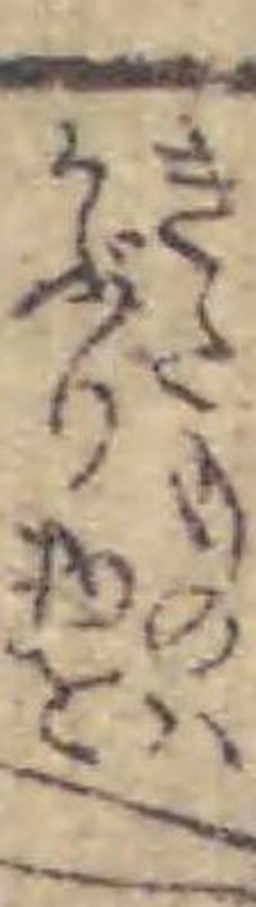かぶり物を
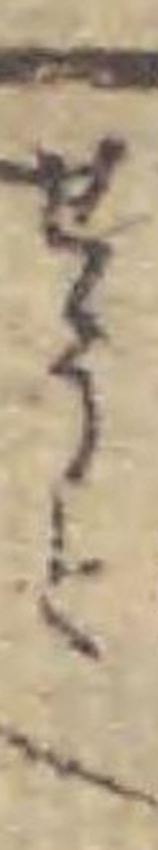せうと
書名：悪七変目景清 : 2巻
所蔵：国立国会図書館 National Diet Library, JAPAN
